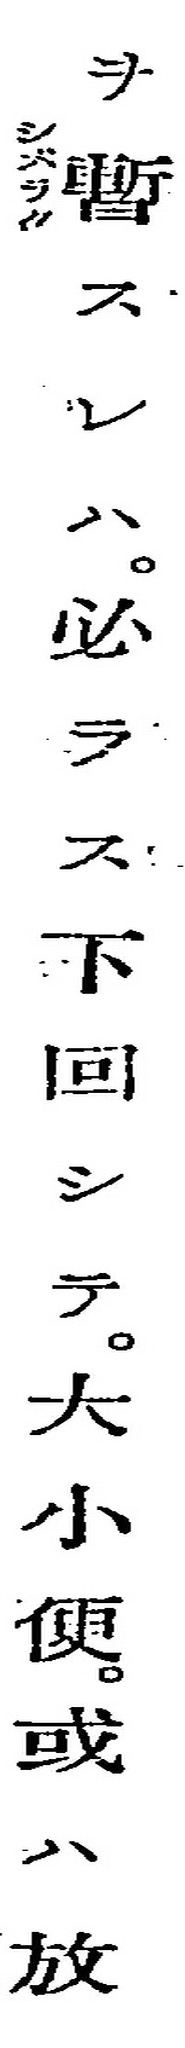を暫すれは。必らす下回して。大小便。或は放
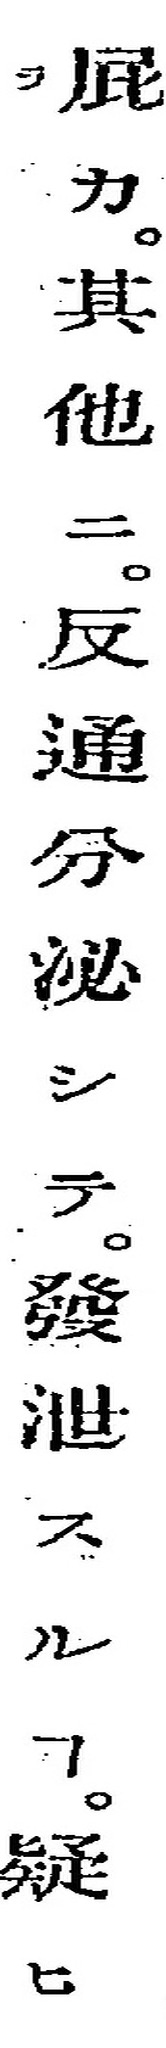屁か。其他に。反通分泌して。發泄すること。疑ひ
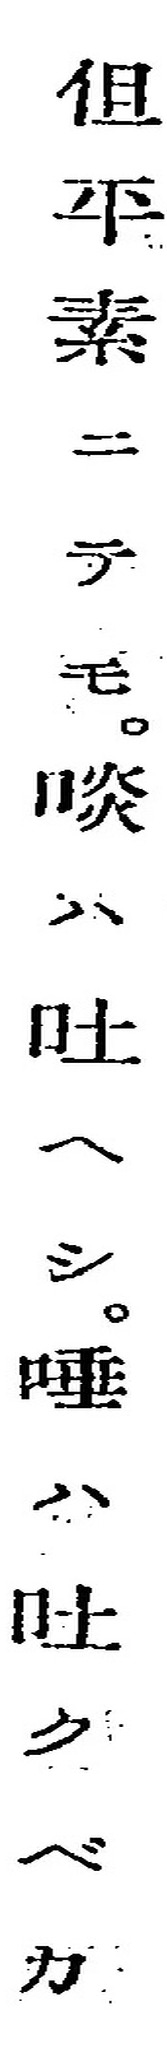但平素にても。啖は吐へし。唾は吐くべか
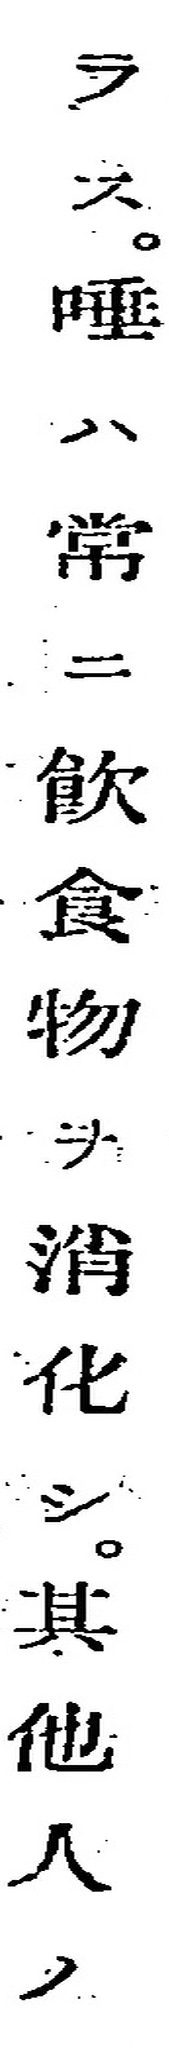らす。唾は常に飲食物を消化し。其他人の
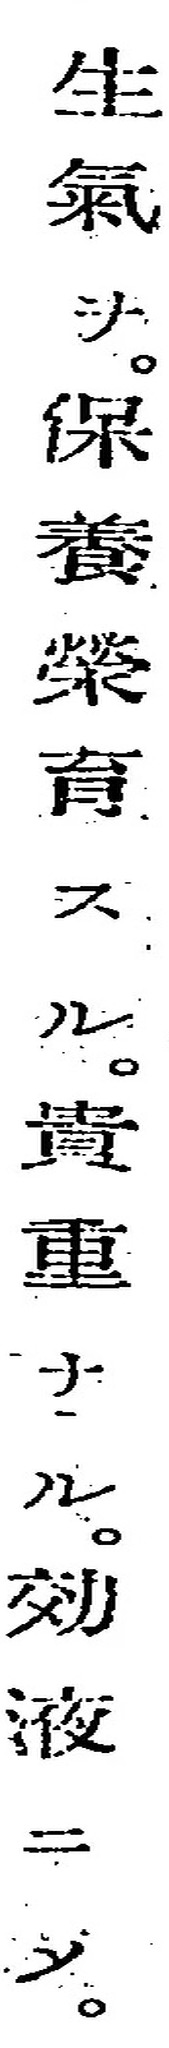生気を。保養栄育する。貴重なる。効液にして。
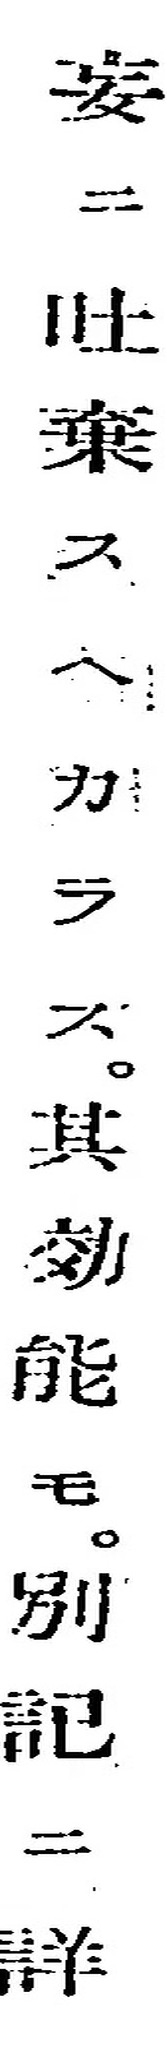妄に吐棄すへからす。其効能も。別記に詳
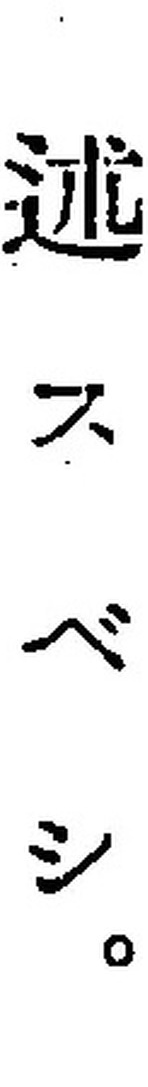述すべし。
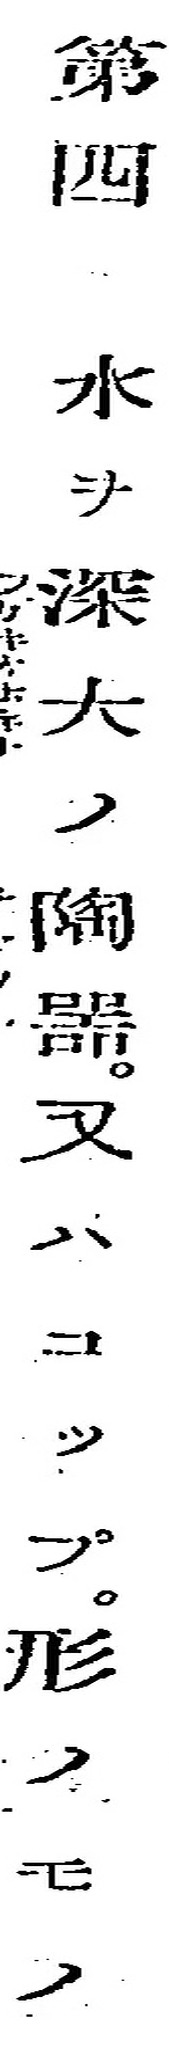第四水を深大の陶器。又はコップ。形のもの
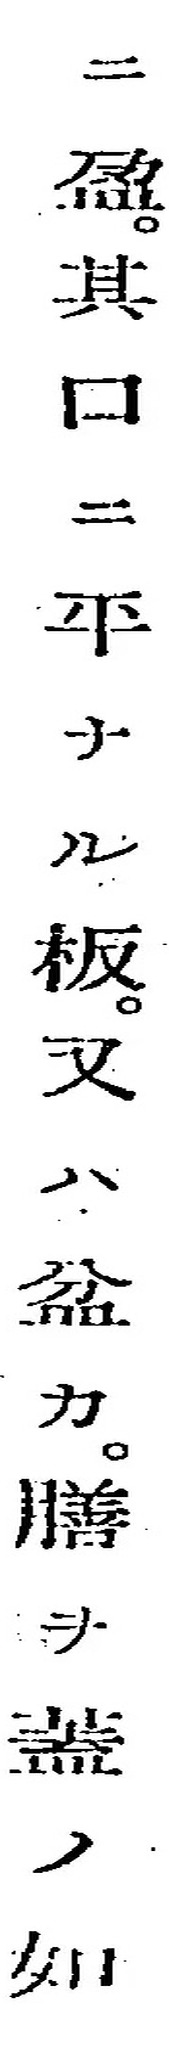に盈。其口に平なる板。又は盆か。膳を蓋の如
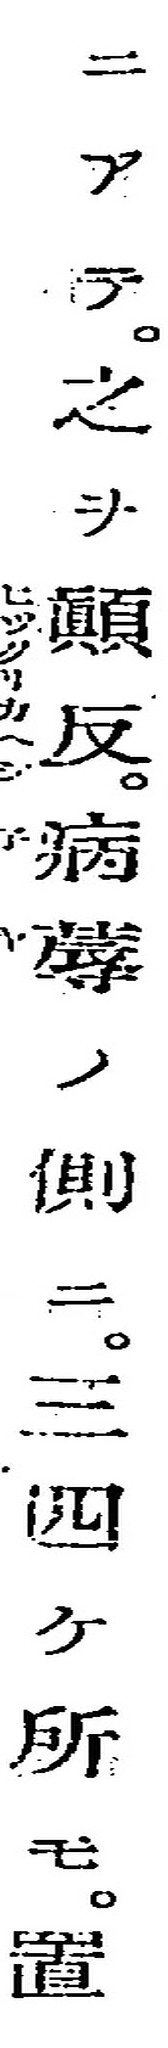にあて。之を顚反。病蓐の側に。三四カ所も。置
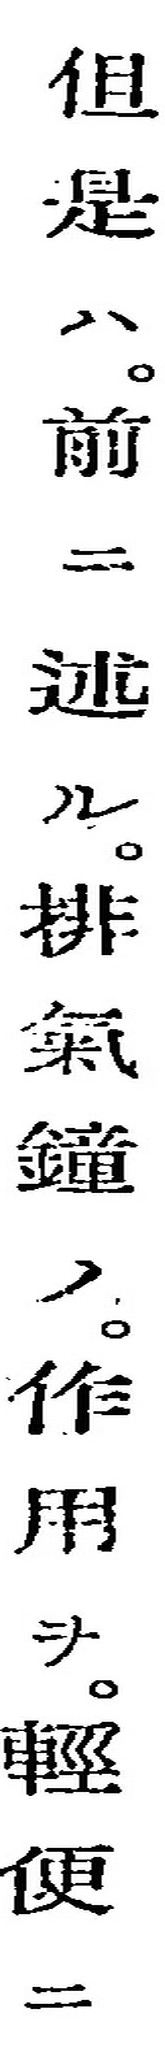但是は。前に述る。排気鐘の。作用を軽便に
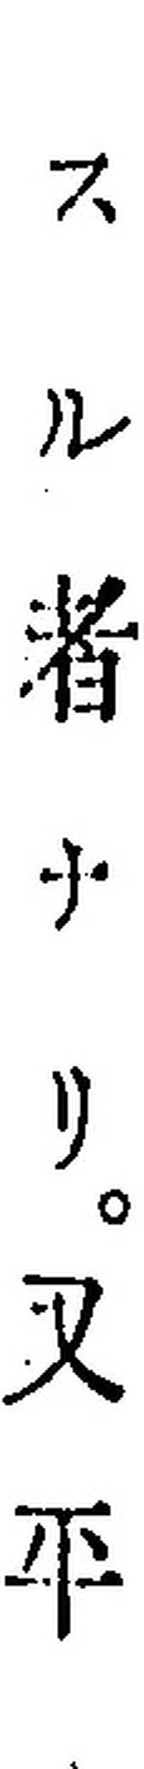する者なり。又平
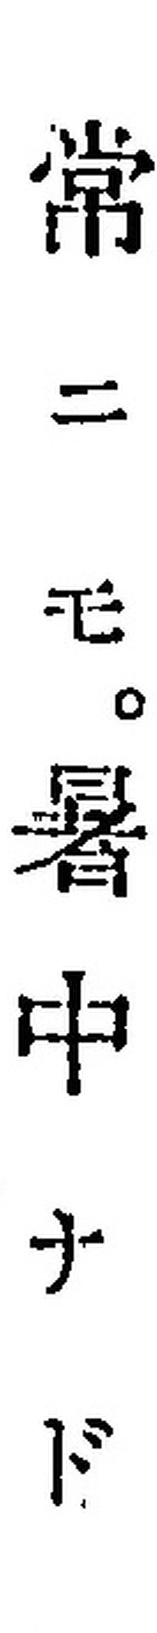常にも。暑中など
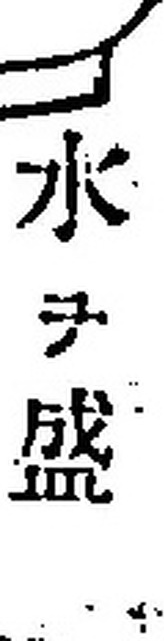水を盛
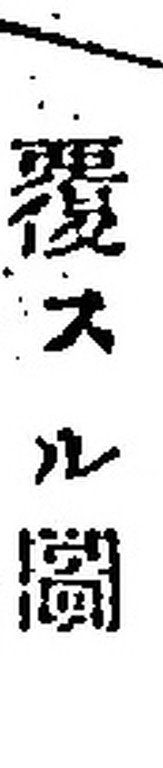覆する図

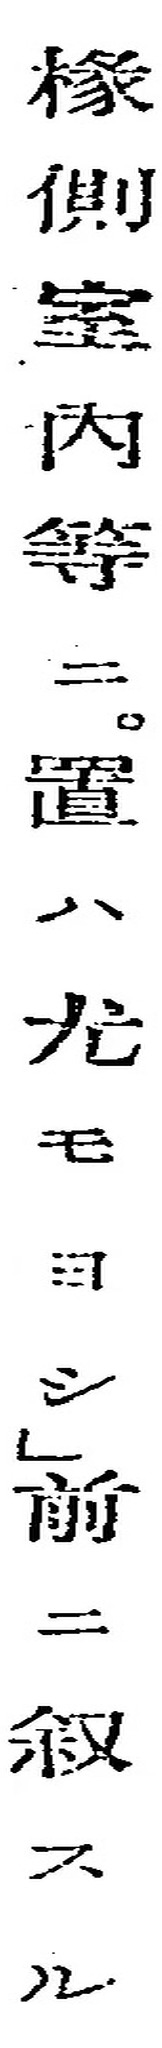椽側室内等に。置は尤もよし」前に叙する
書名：駆疫法 : コレラヲヨケ並ニナホスシカタ
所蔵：国立国会図書館 National Diet Library, JAPAN
